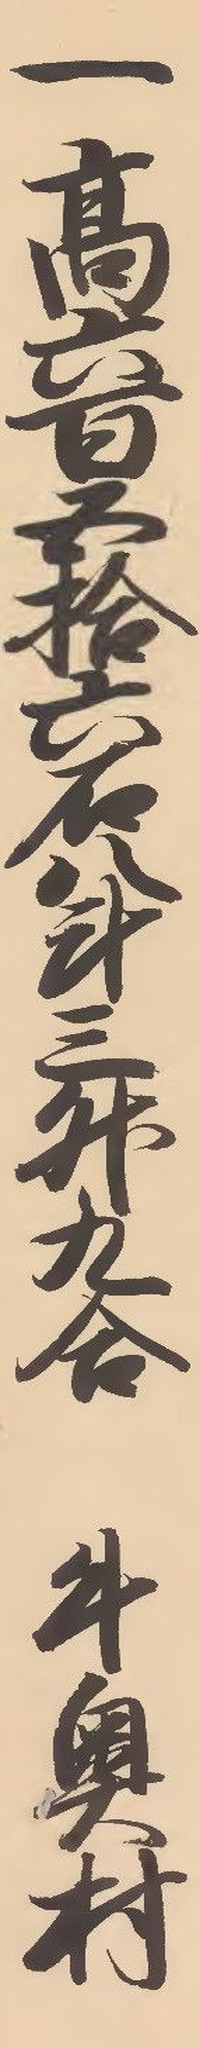一高六百五拾六石八斗三升九合牛奥村
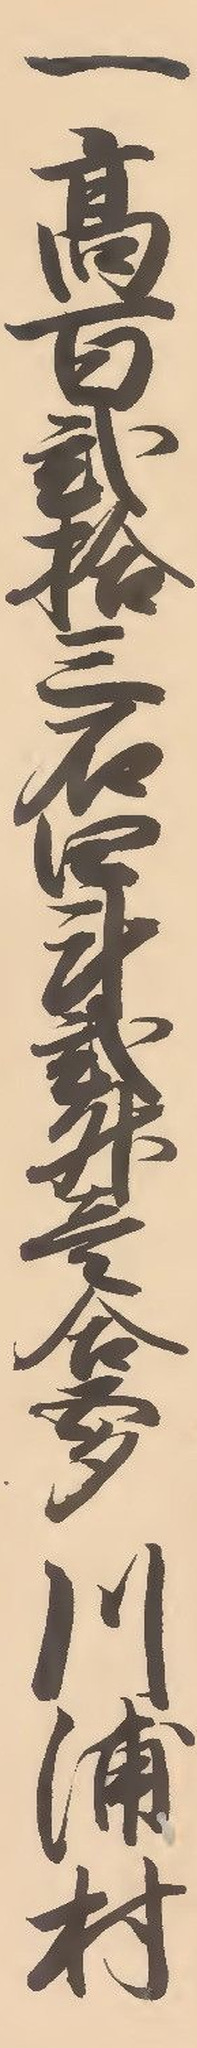一高百弐拾三石四斗弐升壱合五勺川浦村
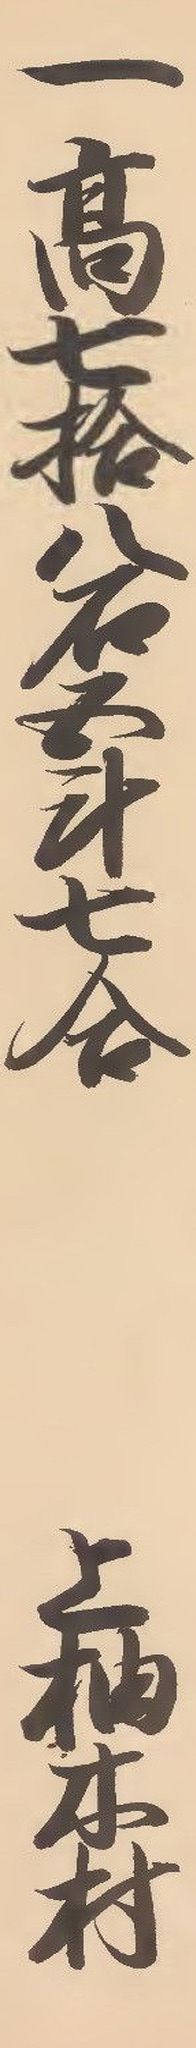一高七拾八石五斗七合上柚木村
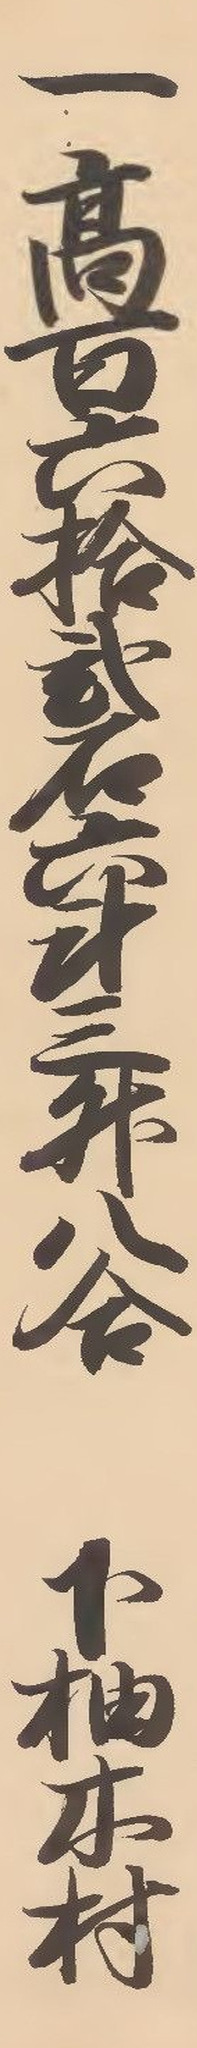一高百六拾弐石六斗三升八合下柚木村
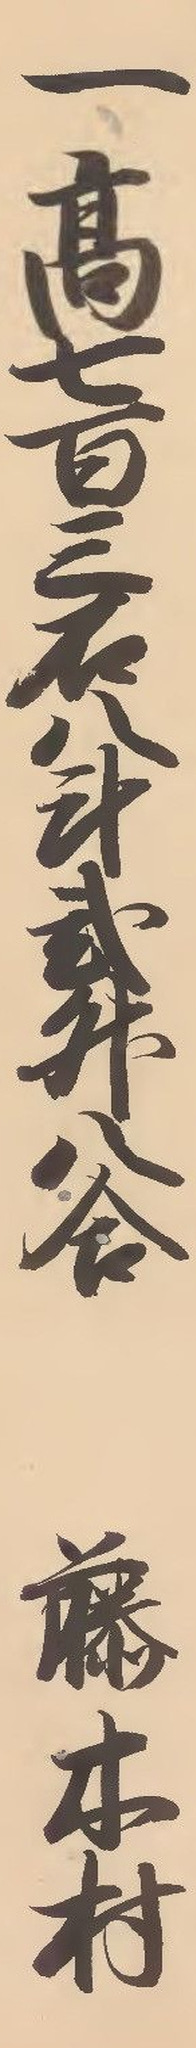一高七百三石八斗弐升八合藤木村

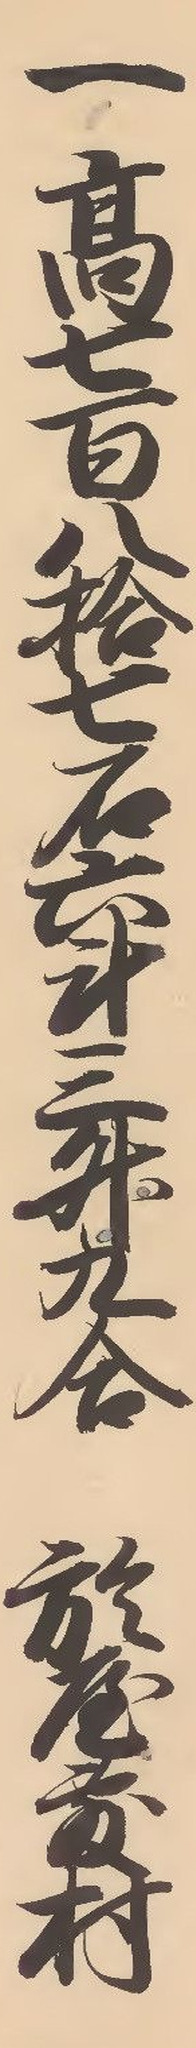一高七百八拾七石六斗三升九合於屋敷村
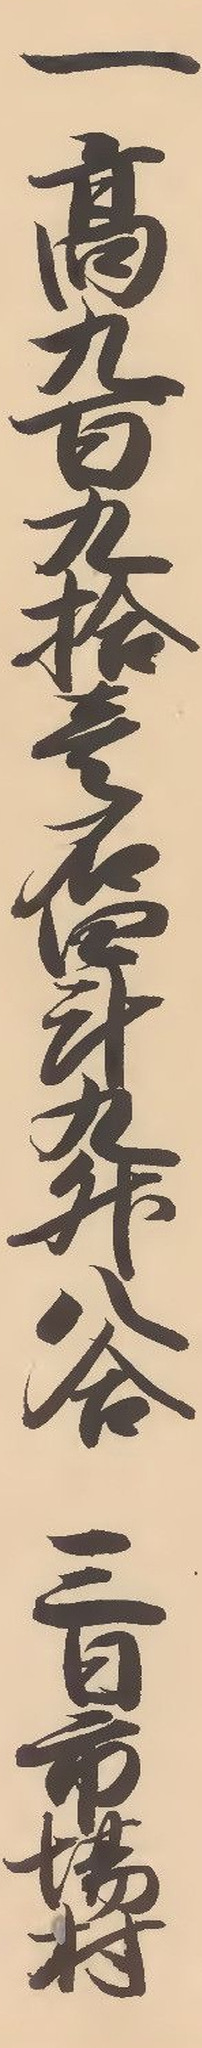一高九百九拾壱石四斗九升八合三日市場村
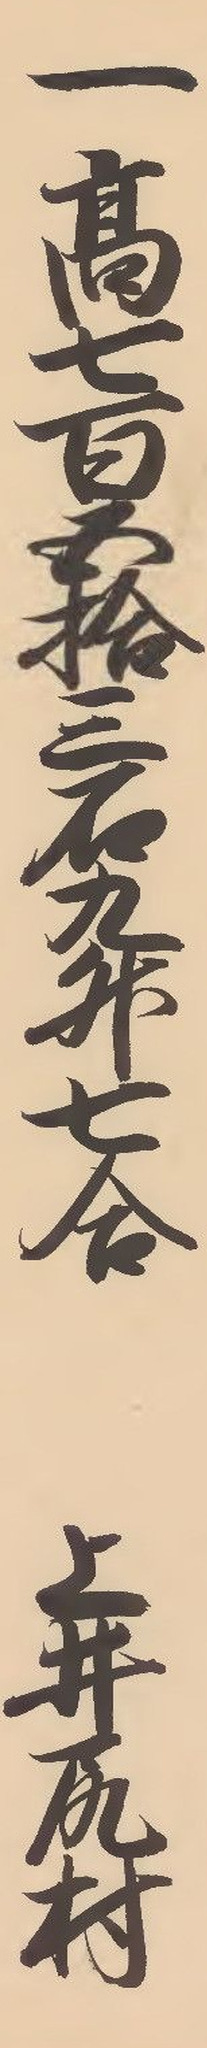一高七百五拾三石九升七合上井尻村
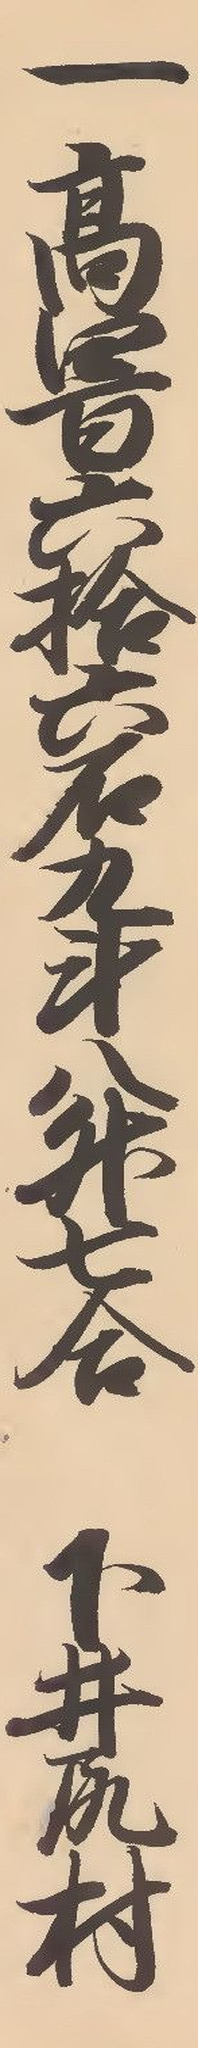一高四百六拾六石九斗八升七合下井尻村
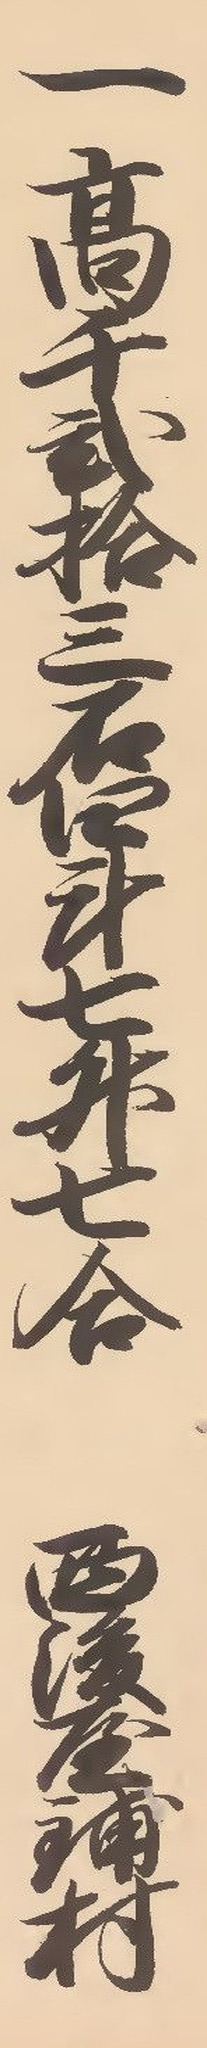一高千弐拾三石四斗七升七合西後屋鋪村
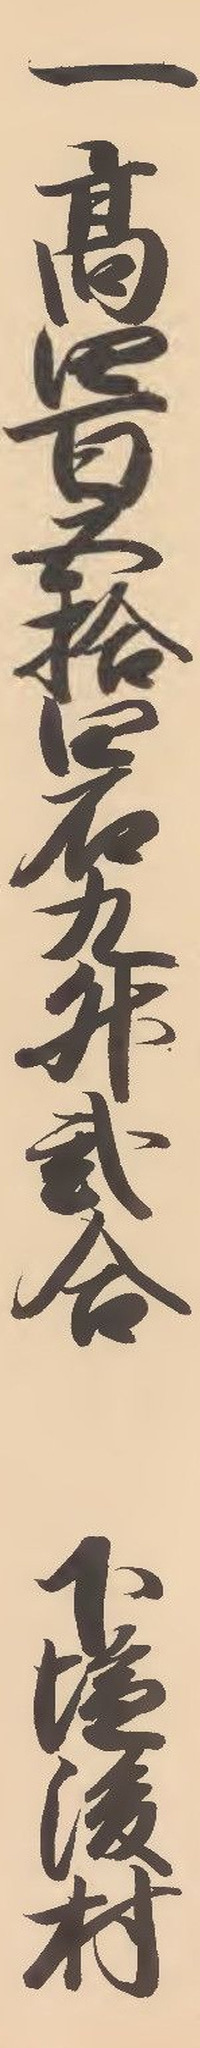一高四百五拾四石九升弐合下塩後村
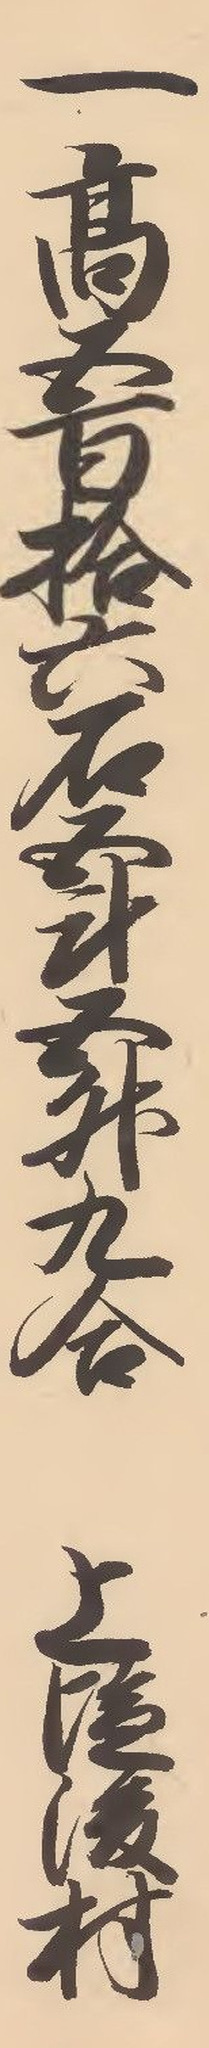一高五百拾六石五斗五升九合上塩後村
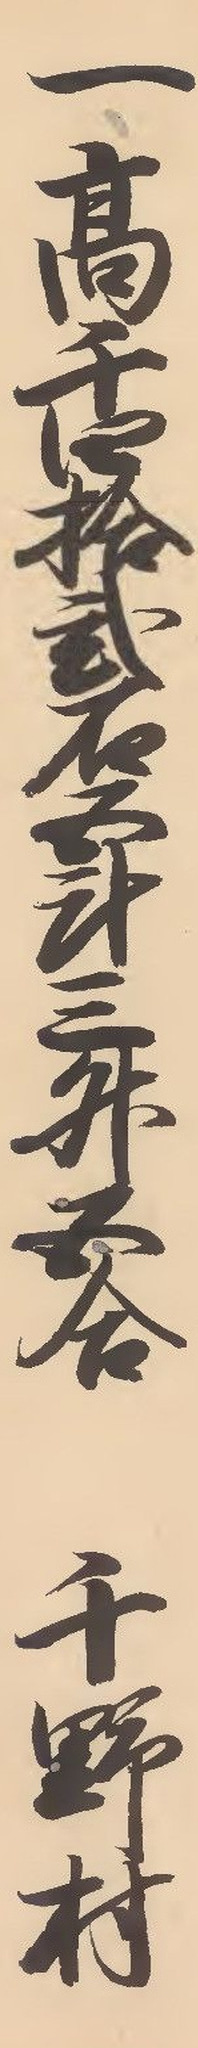一高千四拾弐石五斗三升五合千野村

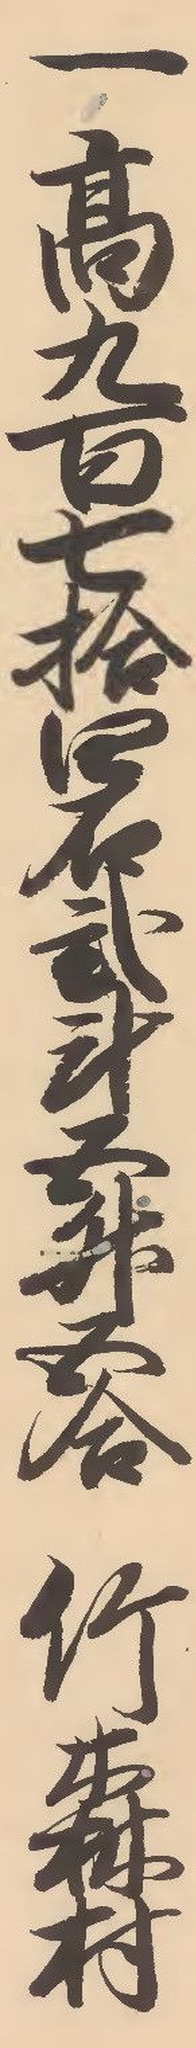一高九百七拾四石弐斗五升五合竹森村
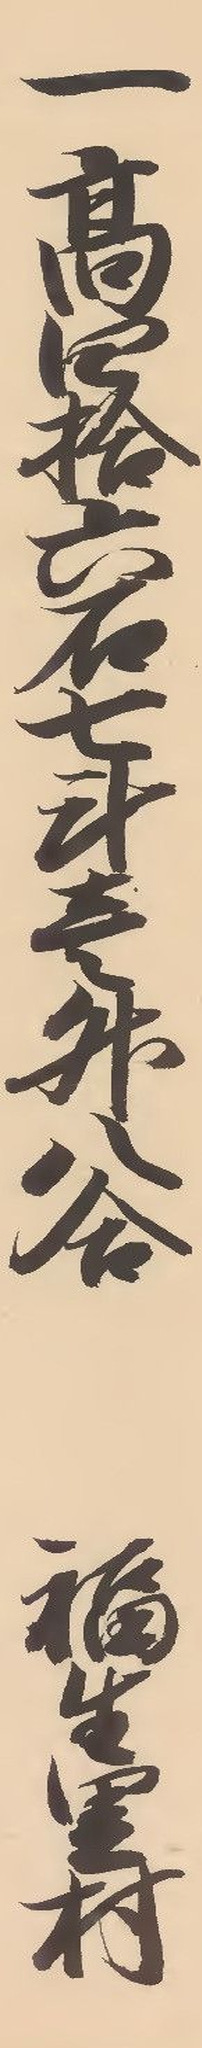一高四拾六石七斗壱升八合福生里村
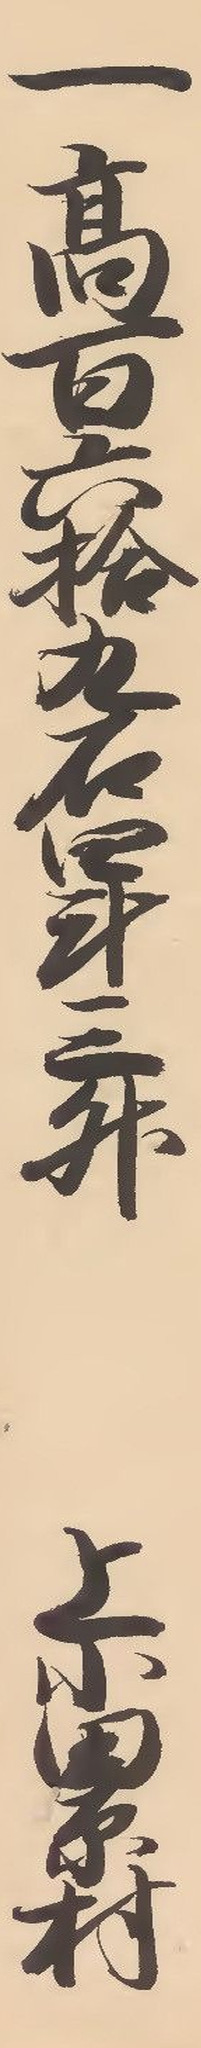一高百六拾九石四斗三升上小田原村
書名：甲斐国郷帳
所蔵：国立公文書館 National Archives of Japan
